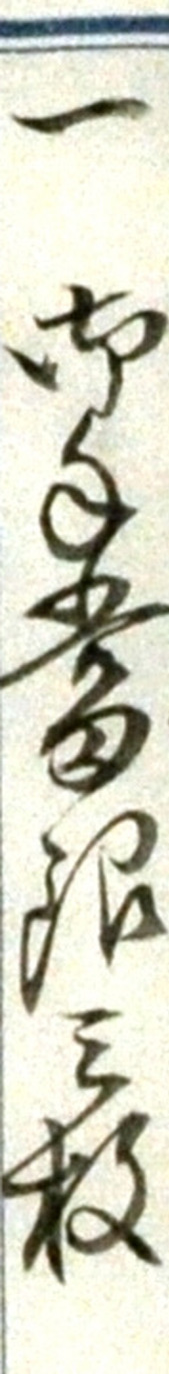一御手当銀三枚
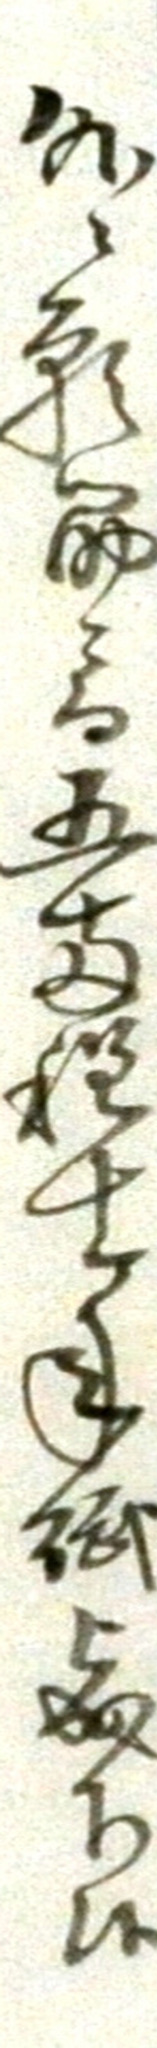外ニ願筋ニ而五両程十ケ年賦被成下候
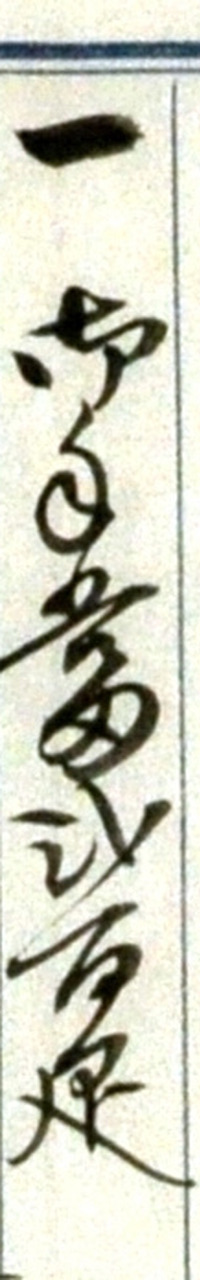一御手当弐百疋
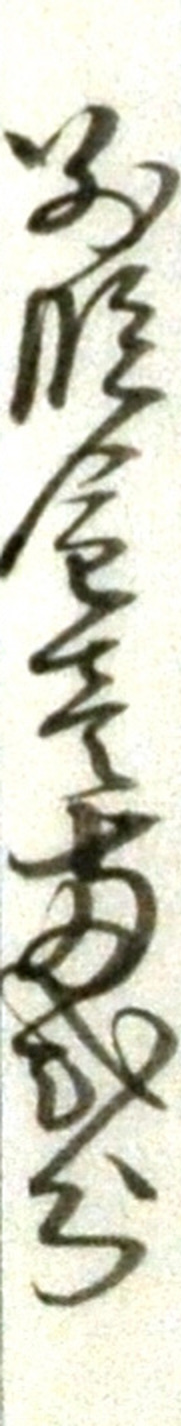別段金壱両弐分

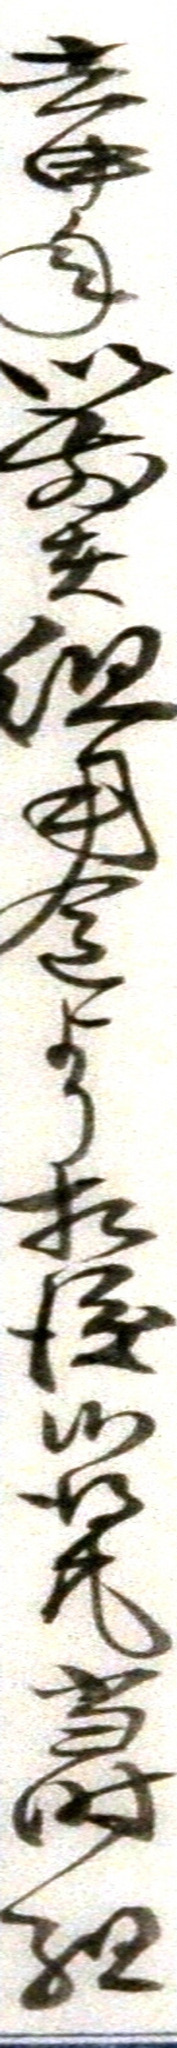去申年以前は組用金より相渡候得共当時組
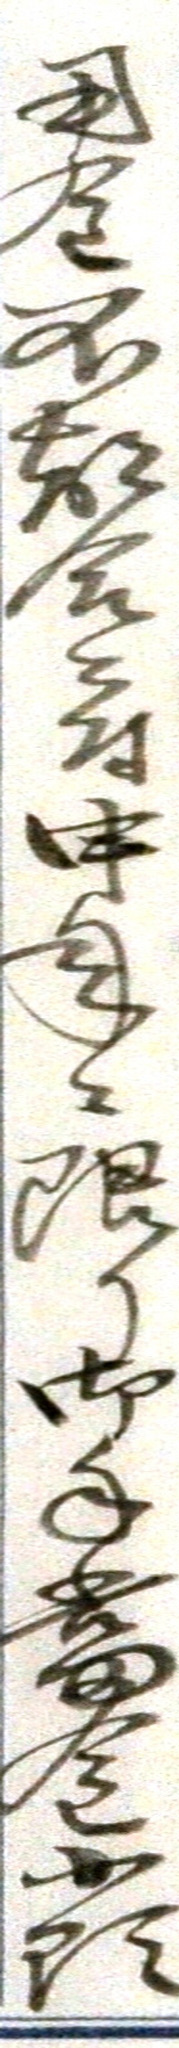用金不都合ニ付申年ニ限り御手当金小頭
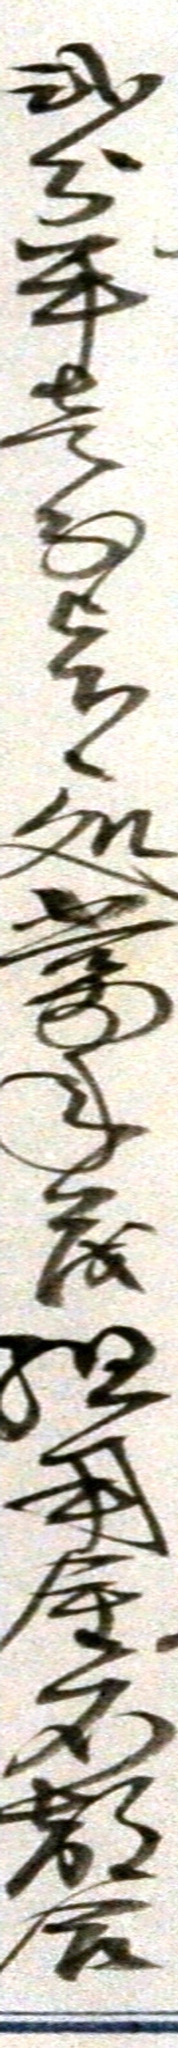弐分平壱分被下候処当年も組用金不都合
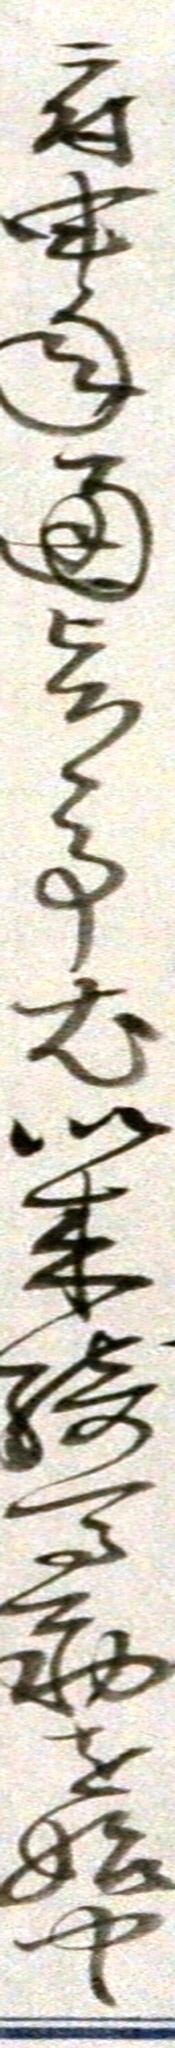ニ付申年通被下候事尤以来騎馬勤を始中
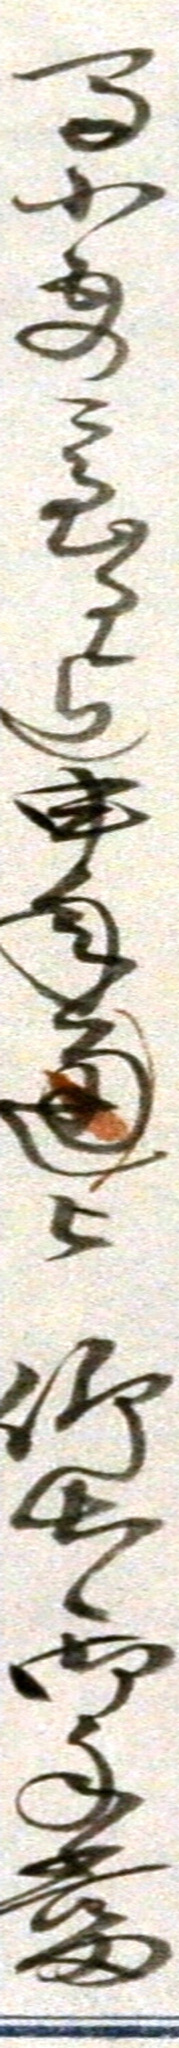間小ものニ至る迄申年通被仰出候御手当
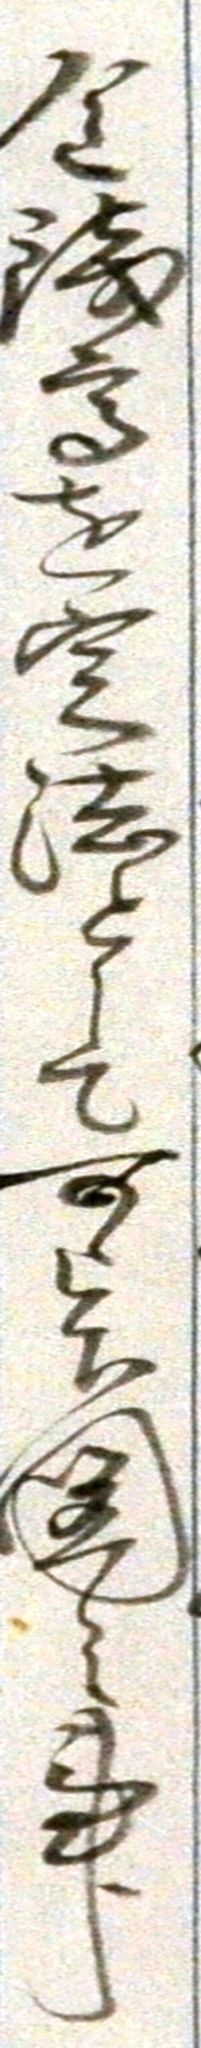金銭高を定法として可被下図之事
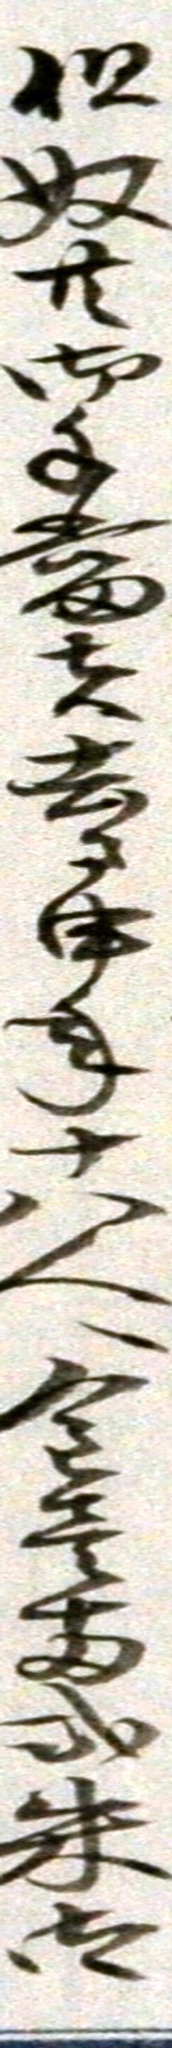但奴共御手当は去る申年十八人へ金壱両弐朱御
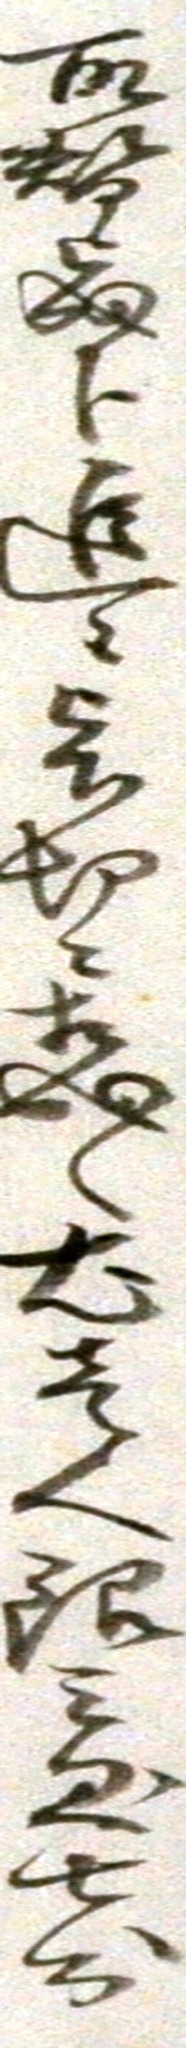取替被成下追々被下切ニ相成候尤壱人銀三匁七分
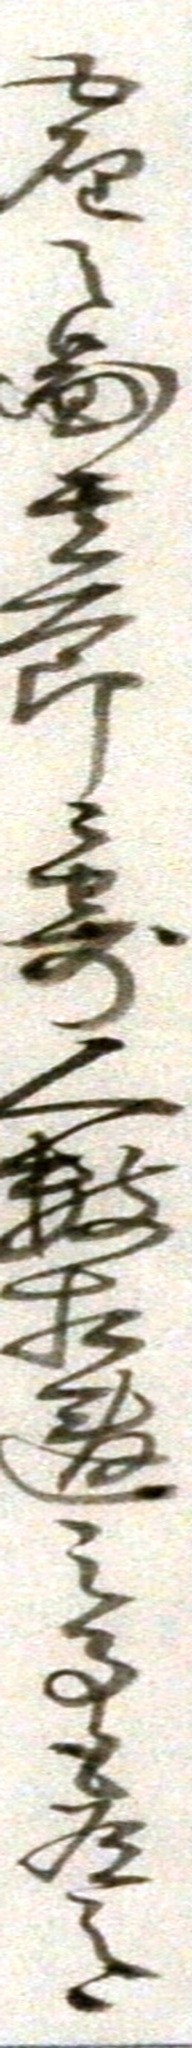五厘之図其節ニ寄人数相違之事も有之候
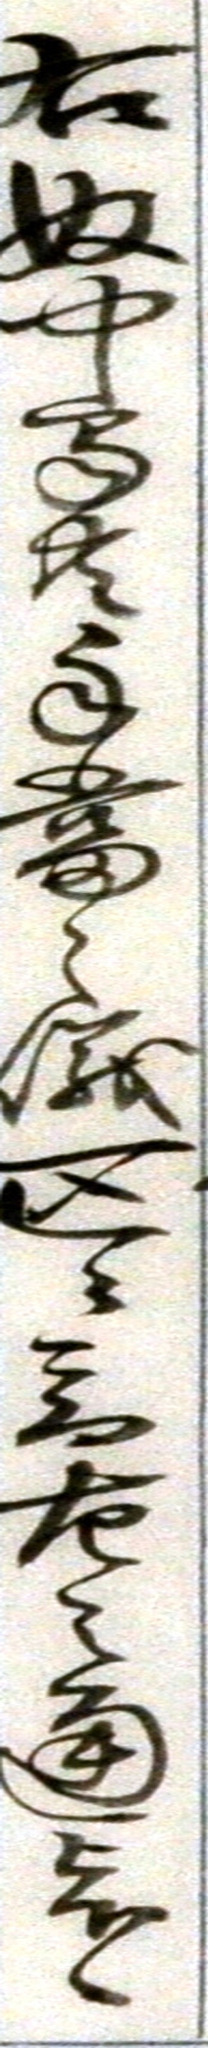右奴中間共手当之儀区々ニ而左之通被下候
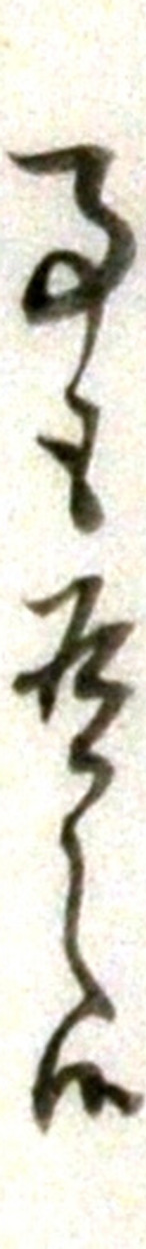事も有之候
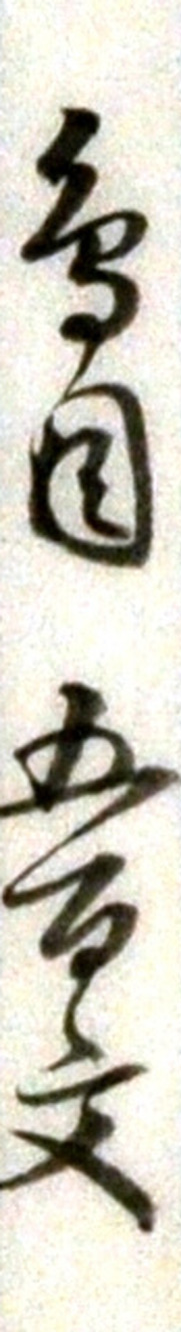鳥目五百文
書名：諏訪御柱祭之節・騎馬大将御中間頭・御柱引人足
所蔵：伊那市立高遠町図書館・合同会社AMANE
